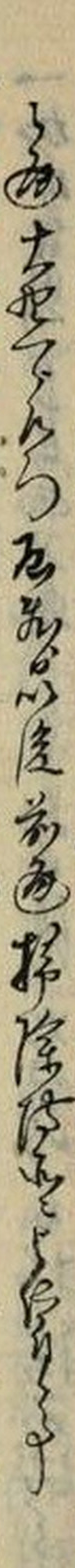之通大野一郎左衛門屋敷ゟ以後前通掃除場所に被仰付候事
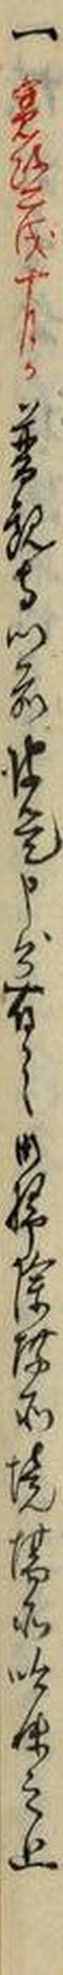一寛政二戌十月か普観寺門前彼是申分有之御掃除場所境場所吟味之上
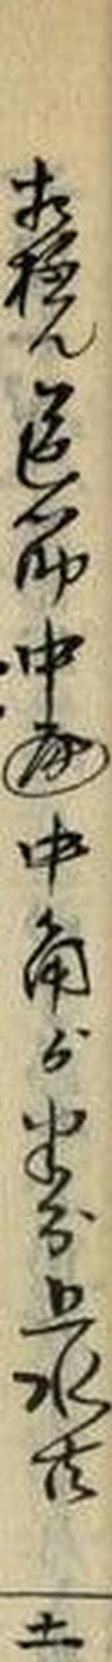相極ル道筋中通中角ゟ半分上水共
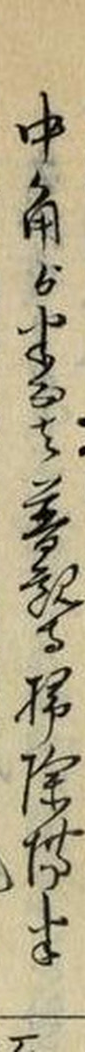中角ゟ半分は普観寺掃除場半
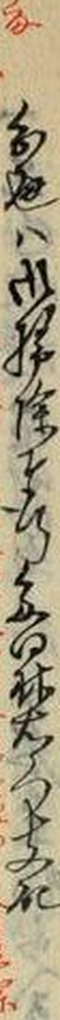分通は御掃除奉行多田林右衛門支配
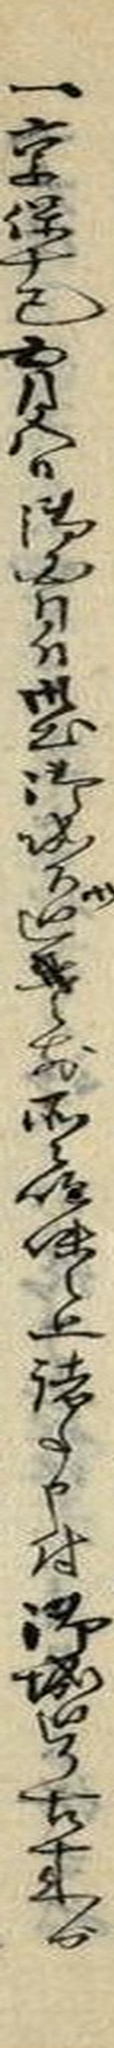一享保十巳五月八日御国目付御出御城下御廻之前所々吟味之上諸事申付御城廻り古来ゟ
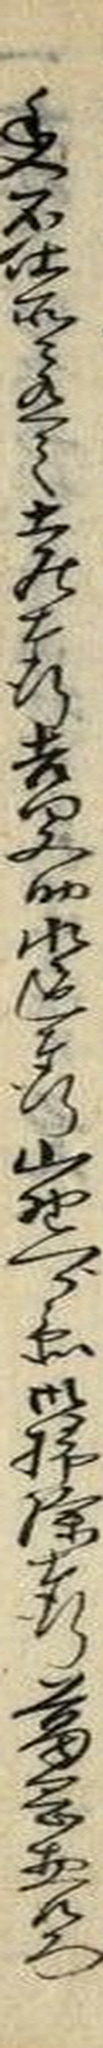手入不仕所々有之土居奉行吉田又助水道奉行山野一郎兵衛御掃除奉行葛岡惣左衛門
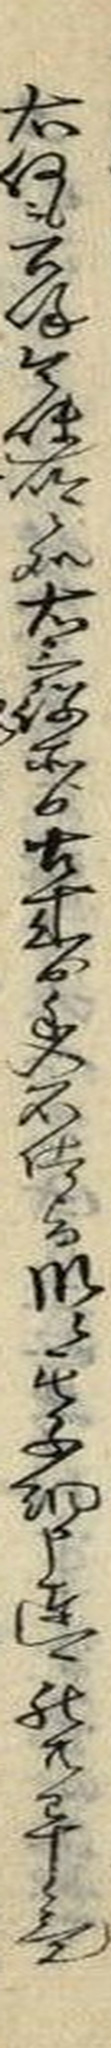右何も召呼令吟味候処右三役所ゟ古来ゟ手入不仕候旨段々其子細申達候然共畢竟
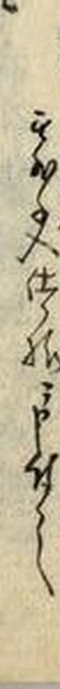其外手入仕候様に申付之
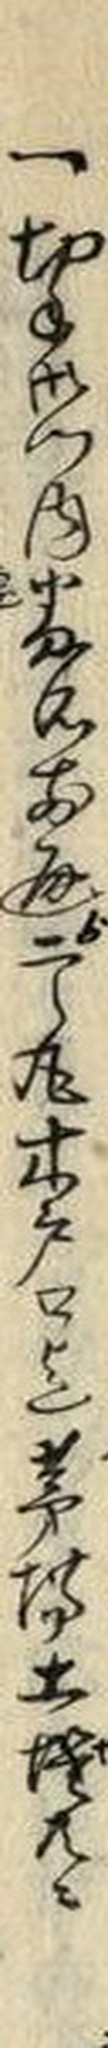一切手御門内番所前通ゟ二之丸木戸口迄茅場土堰共に
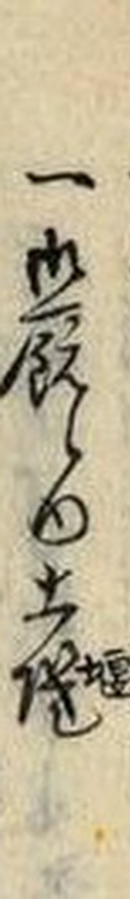一御厩之内土堰
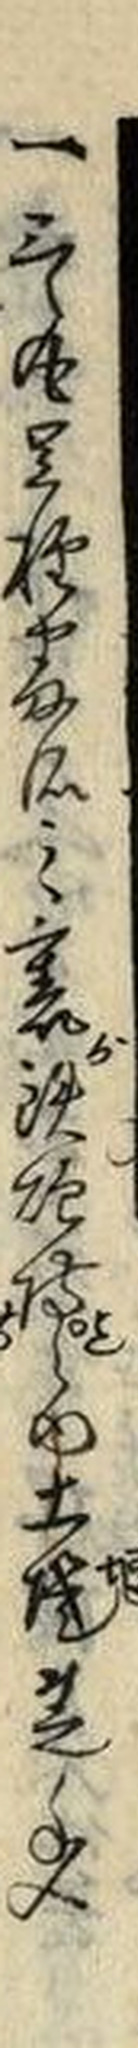一三之丸足軽番所之裏ゟ鉄砲場迄之内土堰芝手入
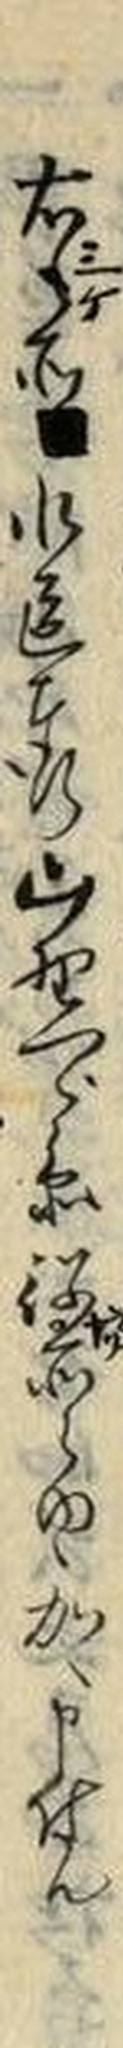右三ケ所水道奉行山野一郎兵衛役場所之内へ加へ申付ル

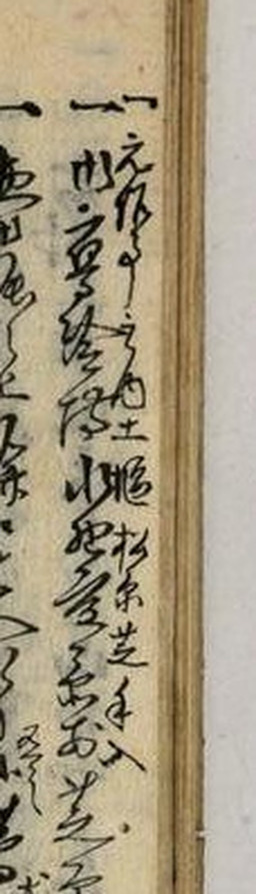一元作事之内土堰松原芝手入
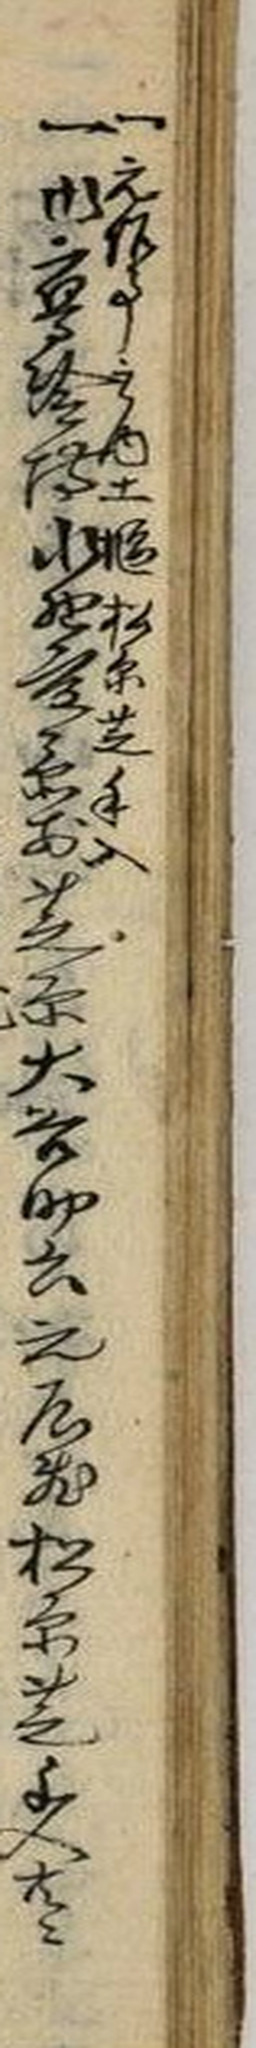一御鷹冷場水野藤兵衛前芝原大谷助六之屋敷松原芝手入共に
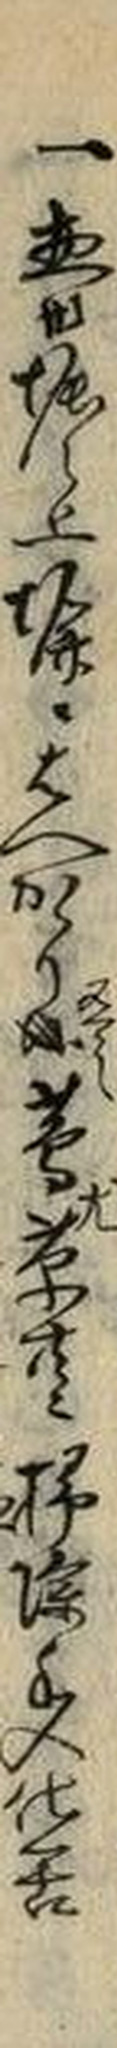一惣御堀之上塀にはへかゝり有之蔦尤草共に掃除手入仕筈
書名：御城下諸事之部
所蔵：福井県文書館 Fukui Prefectural Archives
